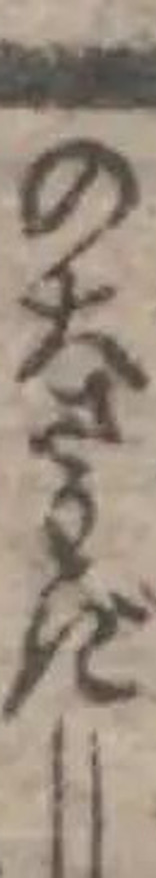の大さわぎ
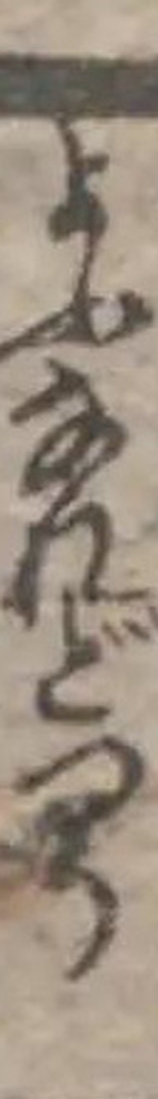よふなれどつう
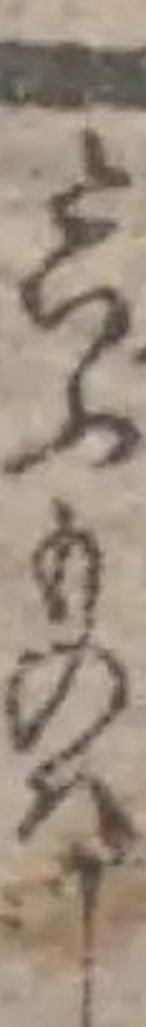といふものは
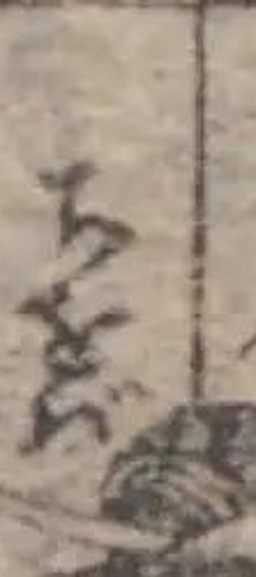ちをば
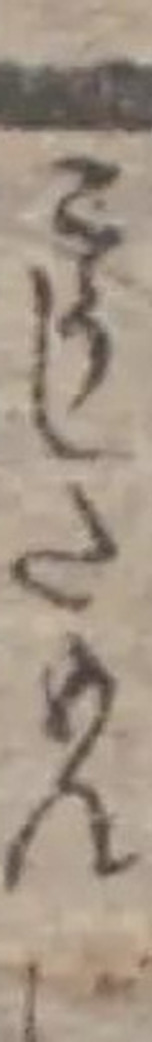こうしたもん
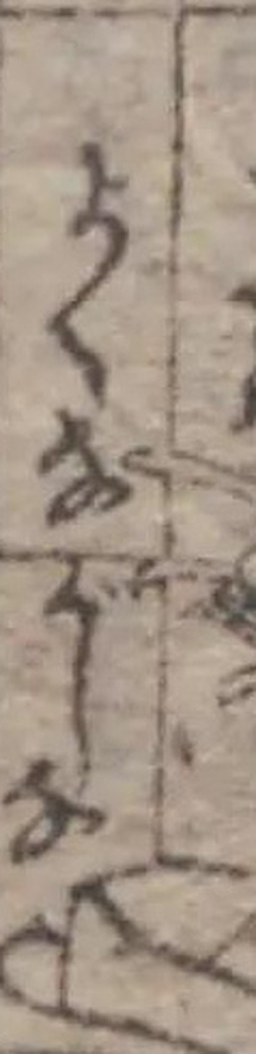よくながしな
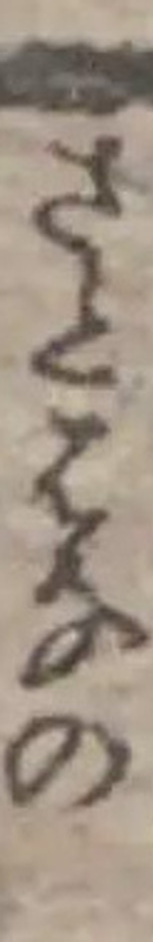さとはなの
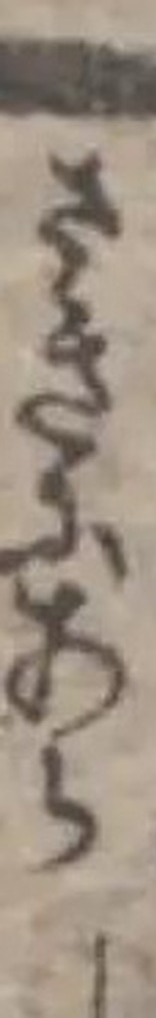さきにあら
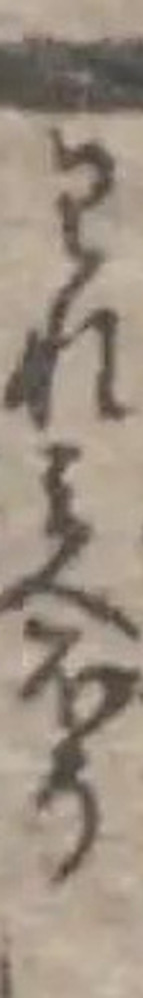われみへほう
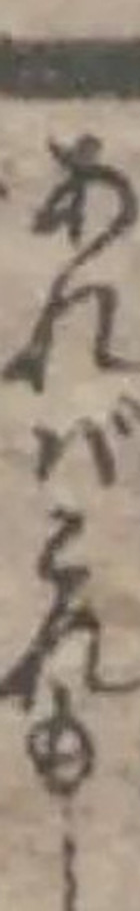あればこれも
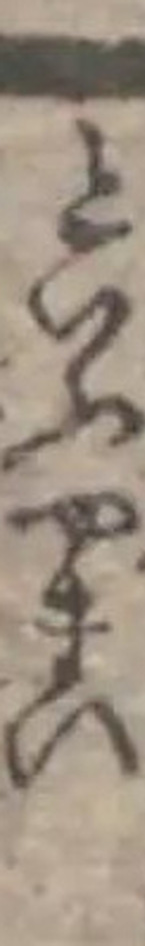といふやまい
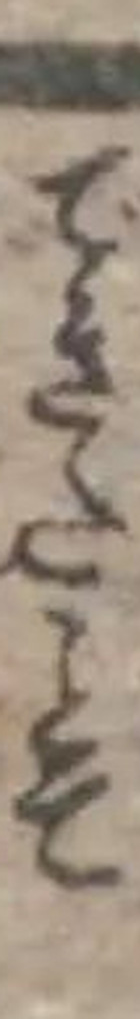できたことて
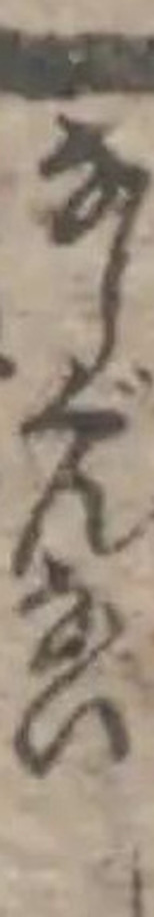なしぐんない
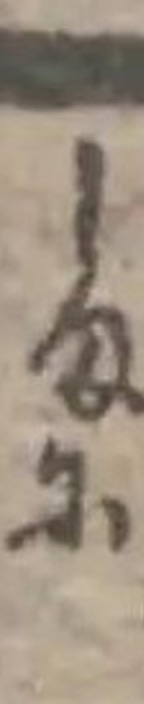しまに
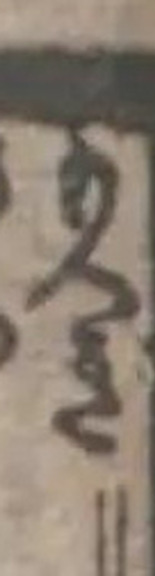もへき
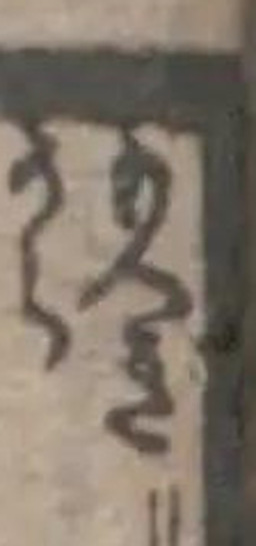もへき
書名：富多高慢噺 3巻
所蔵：国立国会図書館 National Diet Library, JAPAN
